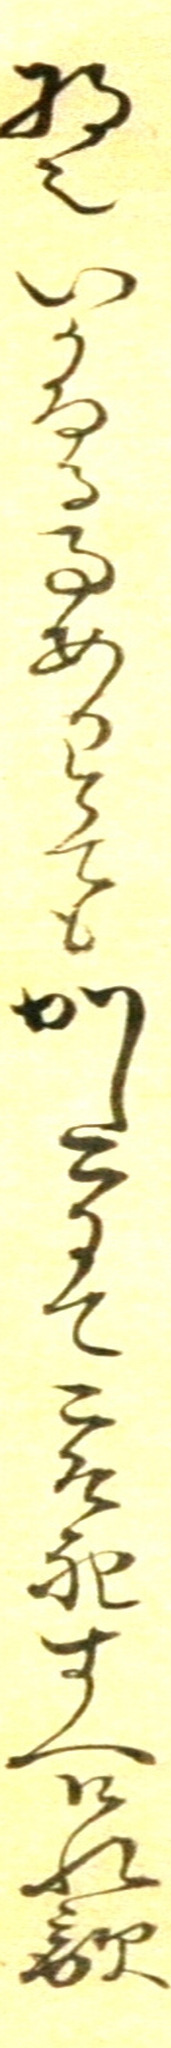将也いかなる事ありとてもかしこにてこそ死すへけれ敵

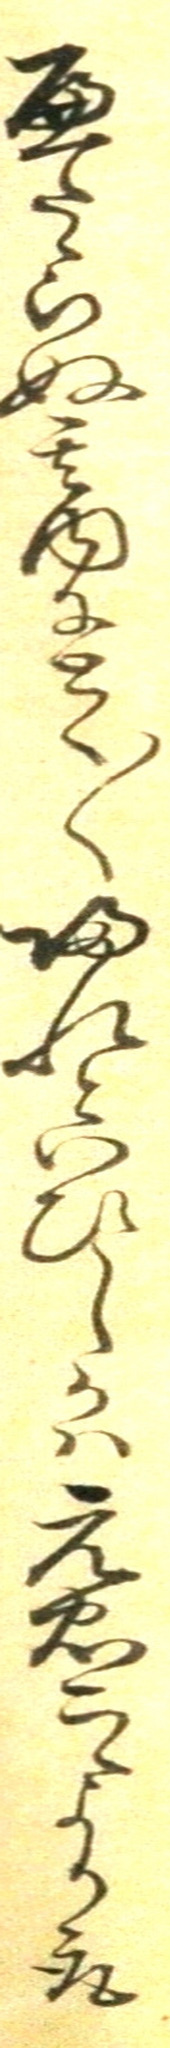へたゝらぬ其内にとく〳〵帰れといひしかは元忠こゝより取
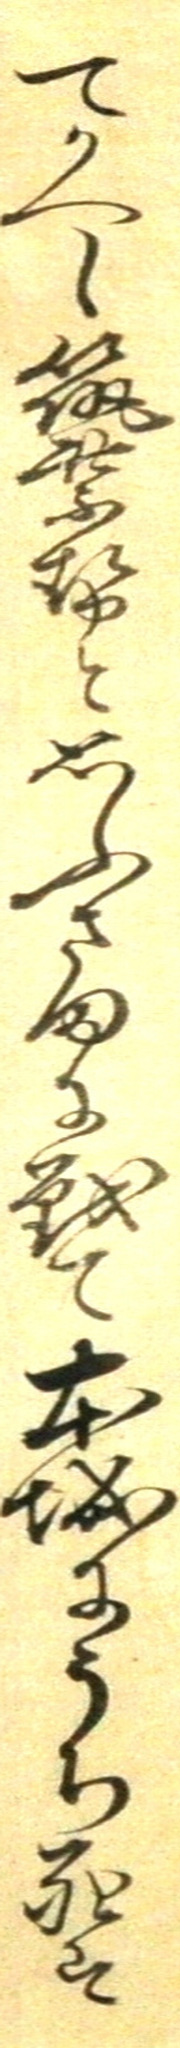てかへし筑紫勢と思ふさまに戦て本城にうち死す
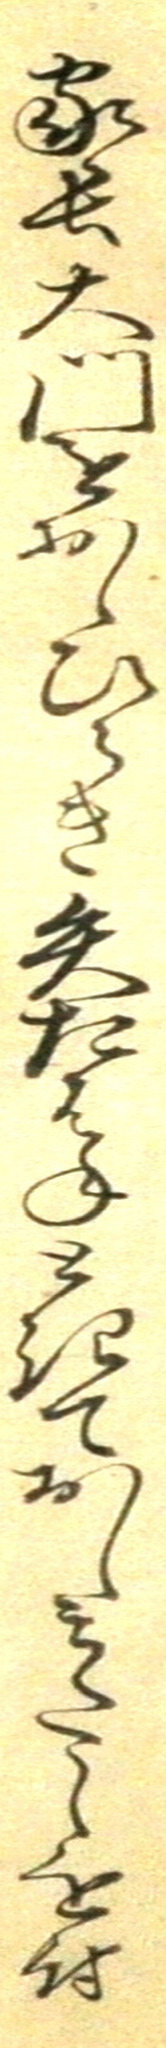家長大門をおしひらき矢たはねときておしみたしを付
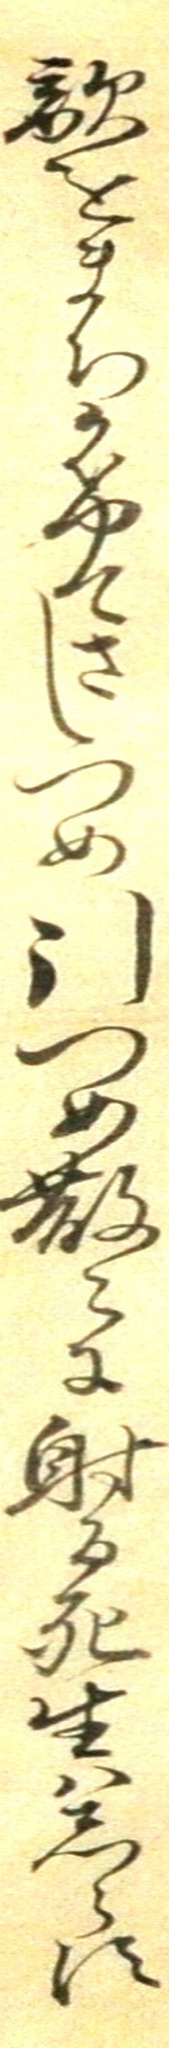敵をまちうけてさしつめ引つめ散々に射る死生はしらす
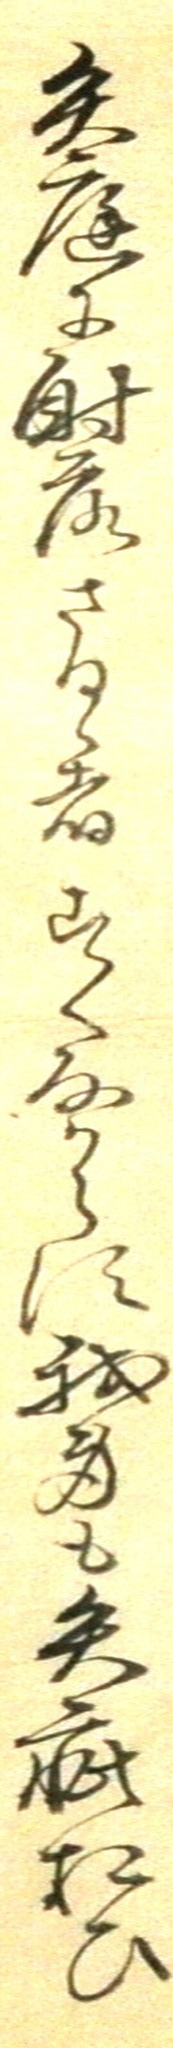矢庭に射落さるゝ者すくなからす我身も矢疵おひ
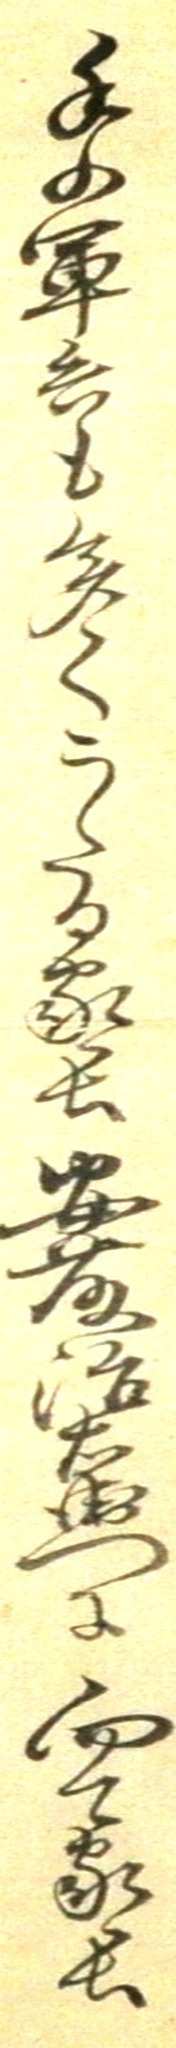手の軍兵も多くうたる家長安藤治右衛門に向て家長
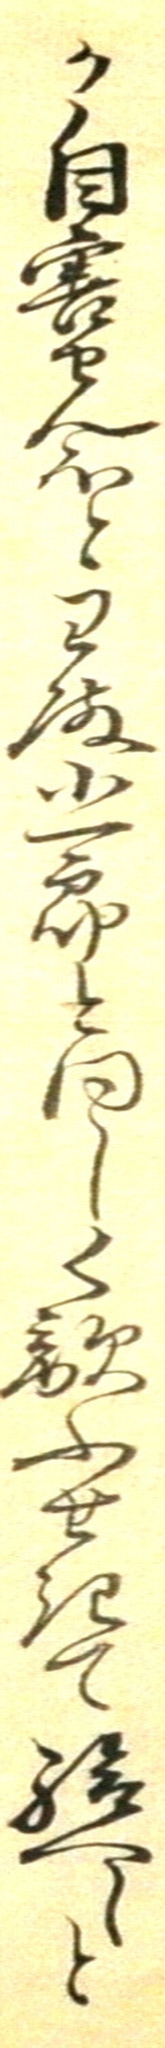か自害せんほとわ殿小一郎同しく敵ふせきて給へしと
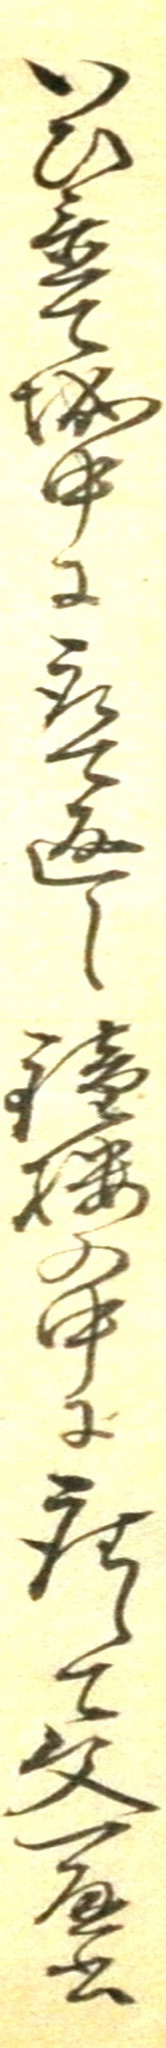いひ置て城中に取て返し鐘楼の中に座して文一通書
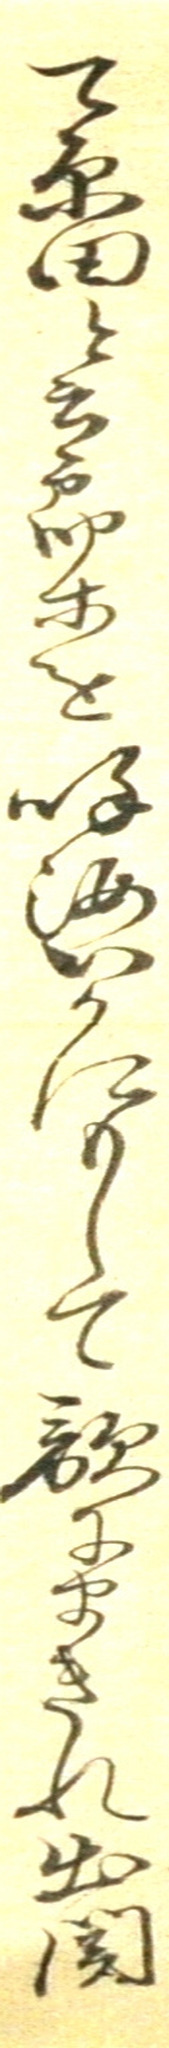て原田と云郎等を呼汝いかにもして敵にまきれ出関
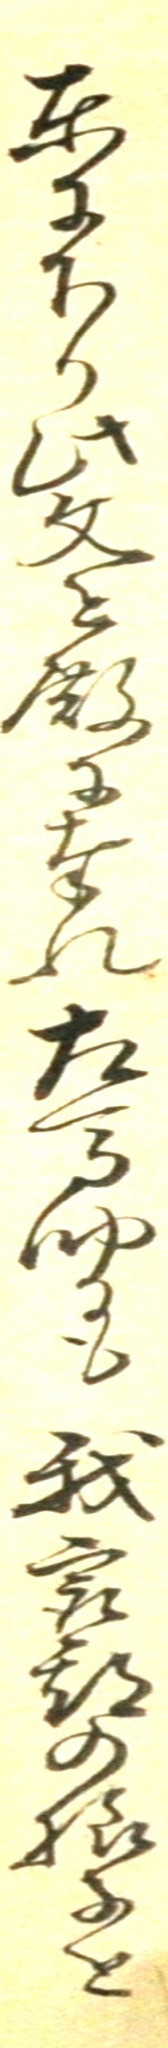東に下り此文を殿に奉れ左馬助にも我最期の様子を
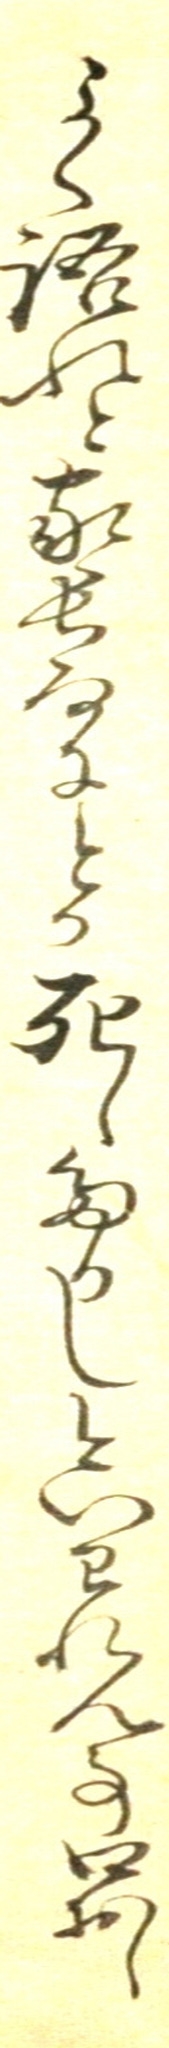よく語れと家長なにとか死したりしといわれん事口おし
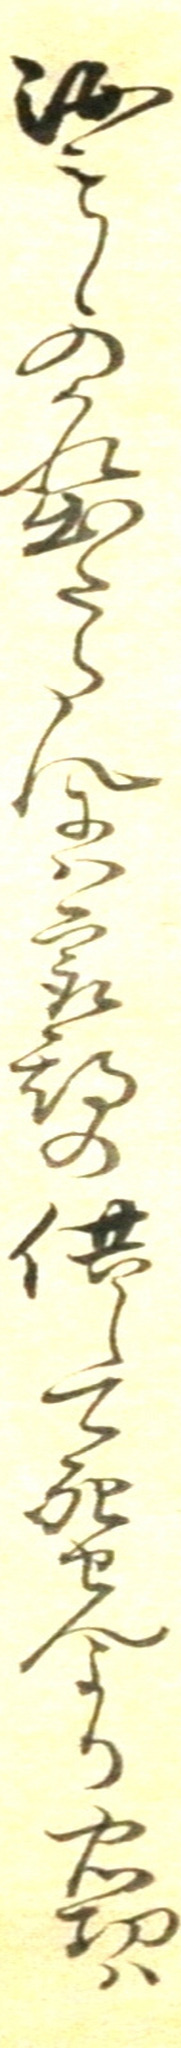汝もしのかれ出たらんには最期の供して死せんより忠功は
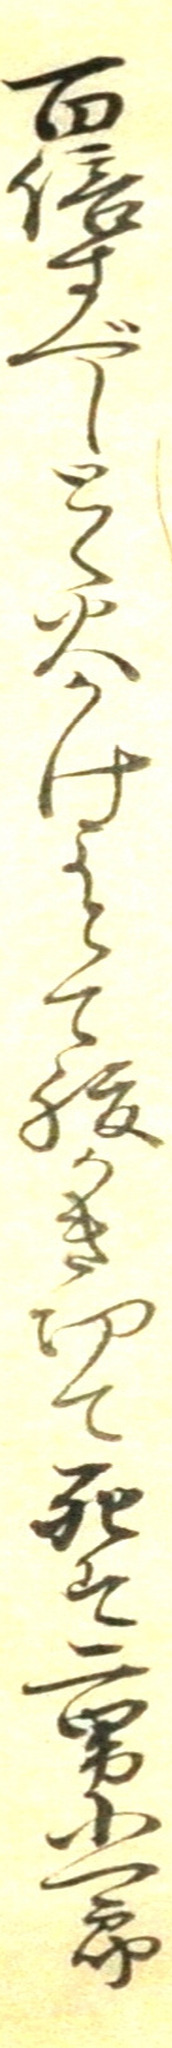百倍すべしとく火かけよとて腹かき切て死す二男小一郎
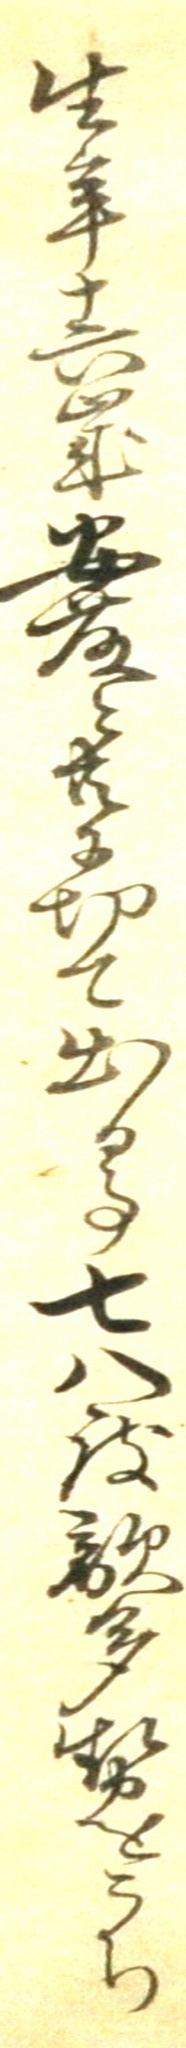生年十六歳安藤と共に切て出る事七八度敵多勢をうち
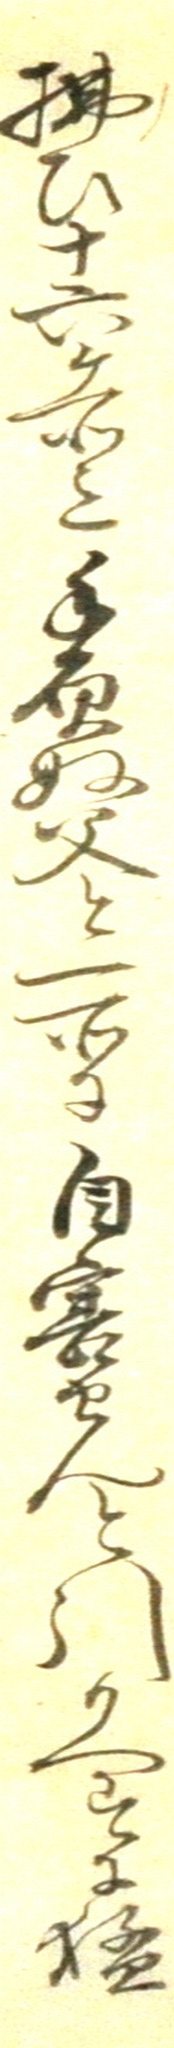払ひ十六ヶ所迄手負ぬ父と一所に自害せんと引かへすに猛
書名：藩翰譜（四・中）
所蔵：伊那市立高遠町図書館・合同会社AMANE
